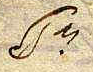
T.as
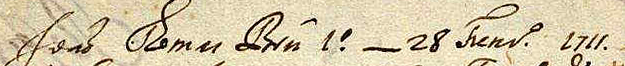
Joaõ Thomas Braz 1º - 28 Feur.o 1711. - 4.5
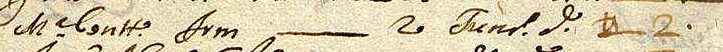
Ma. Contt.o Jrm. - 20 Feur. d.o - 22.
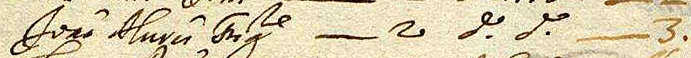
Joaõ Alurez̄ Trig.ro 20 d.o d.o - 3.
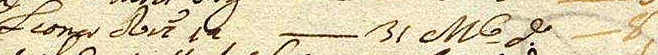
Leonor Roiz̄ 1a - 31 M.co d.o - 8
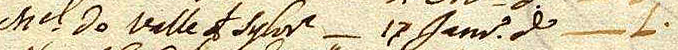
Mel. do Valle d̄ Sylvra - 17 Janr.o do - 1.
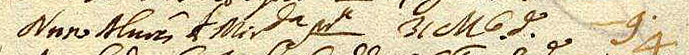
Nuno Alurēs d̄ Mir.da pr.a - 31 M.co d.o - 9
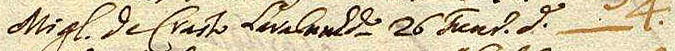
Migl. de Crasto Lara Cunhd.o - 26 Feur.o d.o - 4.
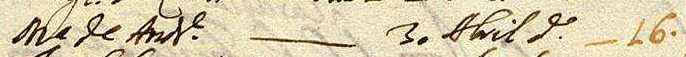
Ma de Andr.e - 30 Abril d.o - 16.
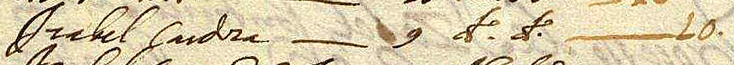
Jzabel Cardoza - 9 d̄.o d̄.o - 10.
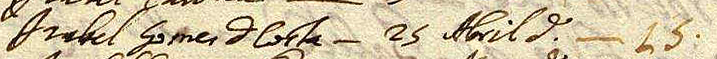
Jzabel Gomes d Costa - 25 Abril d.o - 13.
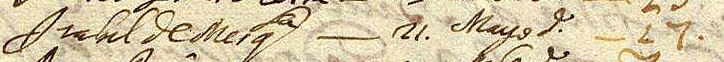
Jzabel de Mesq.ta - 21. Mayo d.o - 17
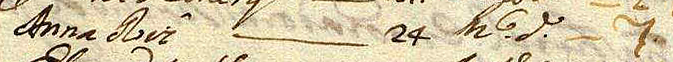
Anna Roiz̄ - 24 M.co d.o - 7.
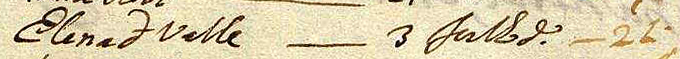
Elena d̄ Valle - 3 Julho d.o - 21.
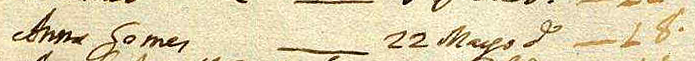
Anna Gomes - 22 Mayo d.o - 18.
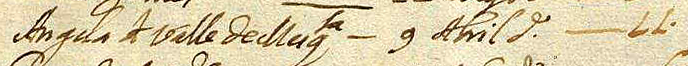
Angela d̄. valle de Mesq.ta - 9 Abril d.o - 11.
